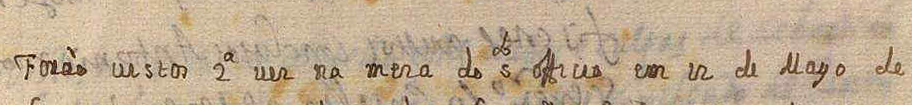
Foraõ uistos 2a uez na meza do sto officio, em 12 de Mayo de
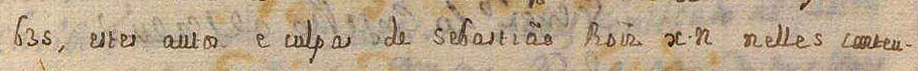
635, estes autos e culpas de Sebastião Roiz̄ x. n nelles conteu
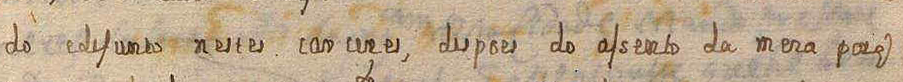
do e defunto nestes carceres, despoes do assento da meza porq̄
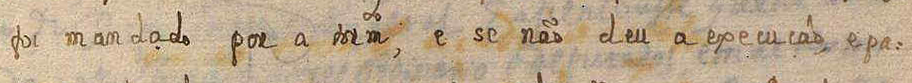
foi mandado por a tormto, e se não deu a execucão, e pa
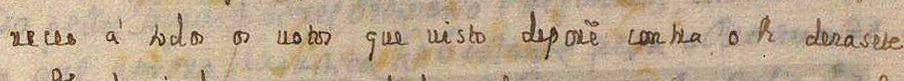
receo à todos os uotos que uisto deporē contra o R dezasete
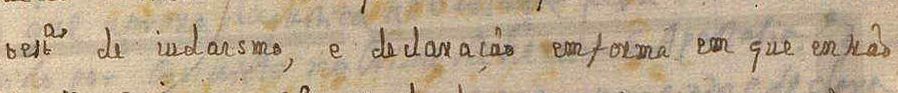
testas de iudaismo, e declaração em forma em que entraõ
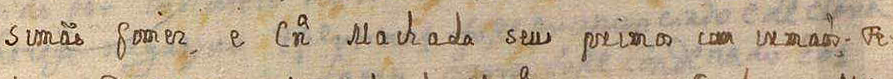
Simão Gomez e Cna Machada seus primos com irmaõs Fe
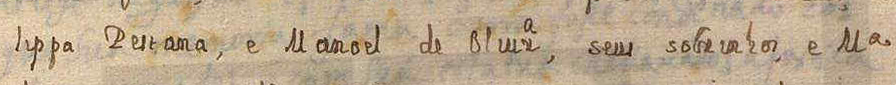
lippa Pestana, e Manoel de Oliura, seus sobrinhos, e Ma
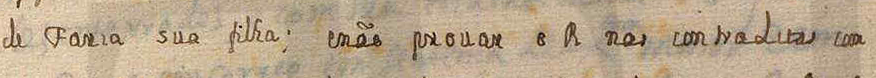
de Faria sua filha; e não prouar o R nas contraditas com
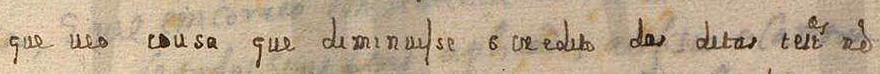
que ueo cousa que diminuisse o credito das ditas testas nē
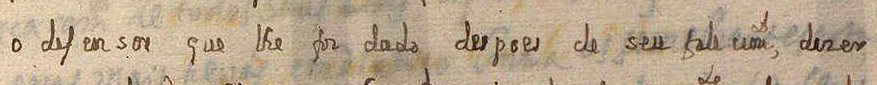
o defensor que lhe foi dado despoes de seu falecimto, dizer
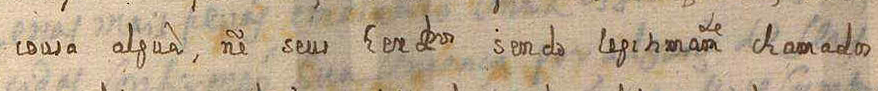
cousa alguā, nē seus herdros sendo legitimamte chamados
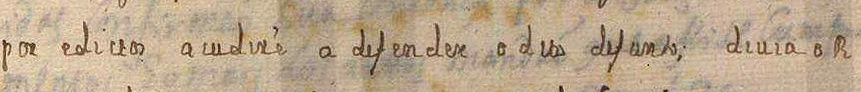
por edictos acudirē a defender o dito defunto; diuia o R
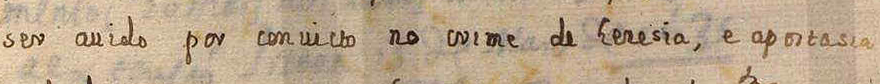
ser auido por conuicto no crime de heresia, e apostasia
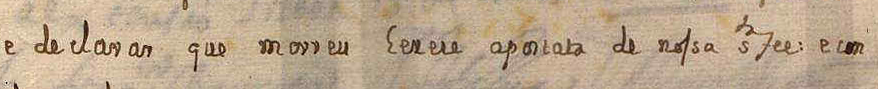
e declarar que morreu hereie apostata de nossa sta fee: e con
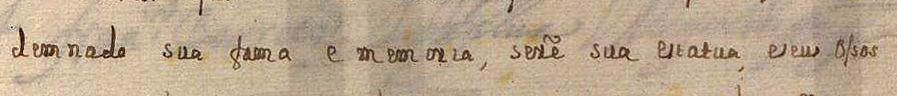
demnado sua fama e memoria, serē sua estatua, e seus ossos
